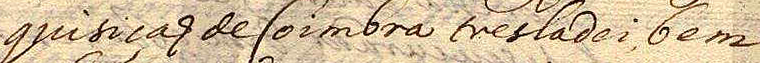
quisiçaõ de Coimbra tresladei, bem
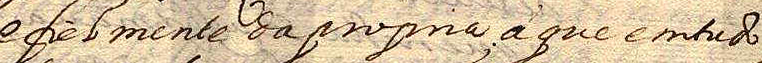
e fielmente da propria, a que em tudo
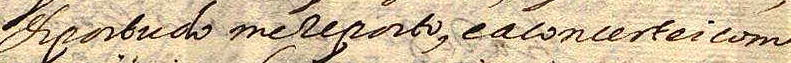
& por tudo me Reporto, e a concertei com
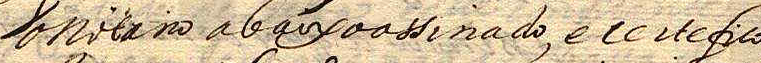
o notario abaixo assinado, e certefico
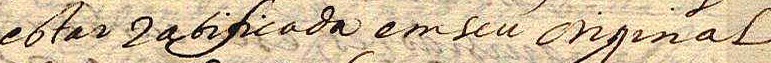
estar Ratificada em seu originaL
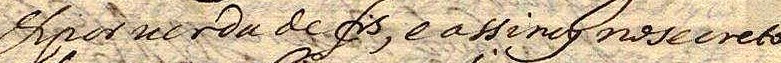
& por uerdade fis, e assiney no secreto
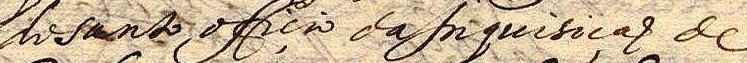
do santo offiçio da Jnquisiçaõ de
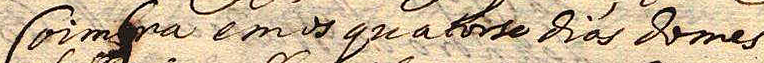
Coimbra em os quatorse dias do mes
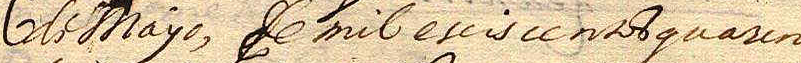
de Mayo, de mil e seiscentos quaren
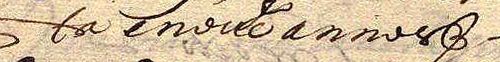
ta e noue annos
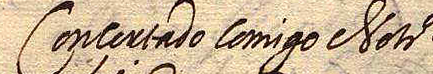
Conçertado Comigo Notro.
